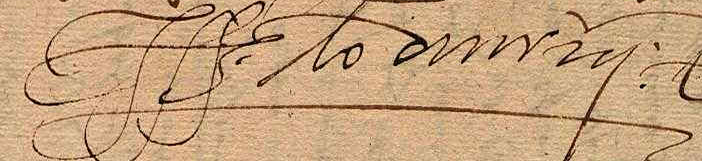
Jffꝭ dō anrriq̄
